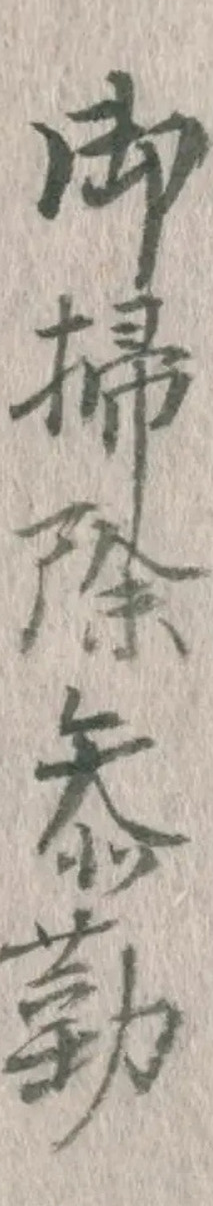御掃除参勤
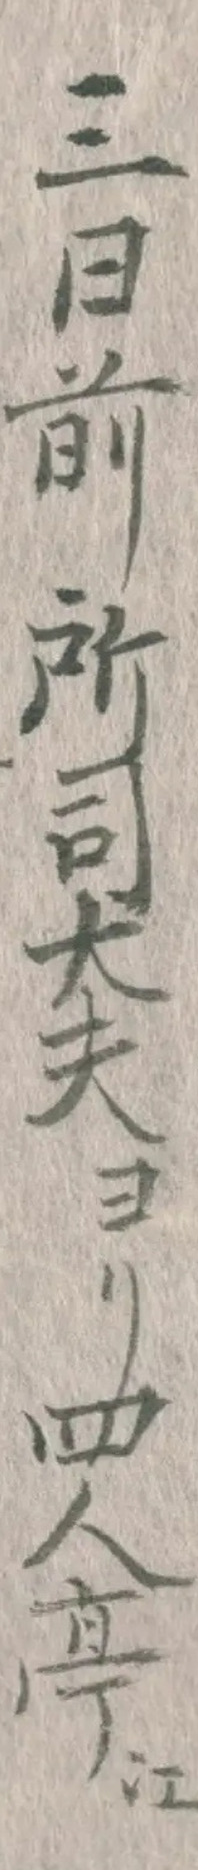三日前所司大夫ヨリ四人亭エ
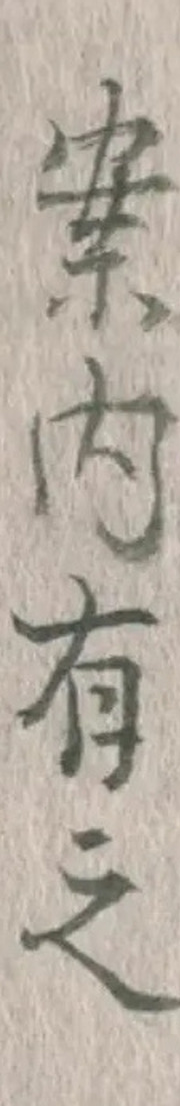案内有之
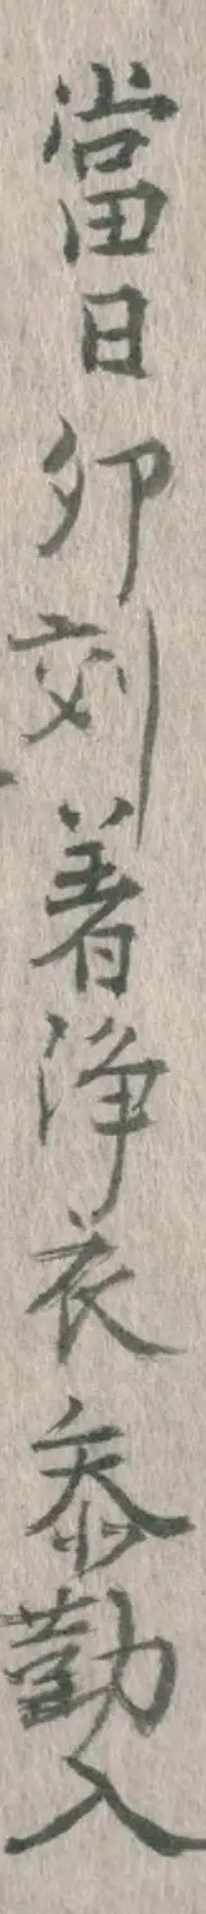當日卯刻着浄衣参勤入
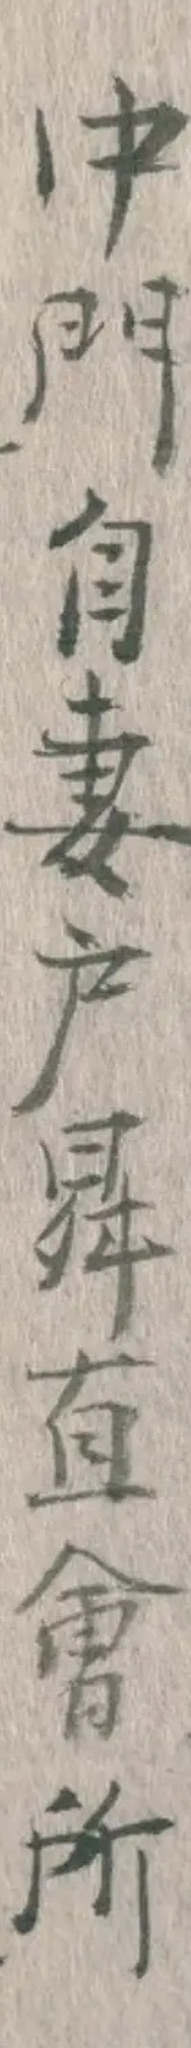中門自妻戸昇直會所
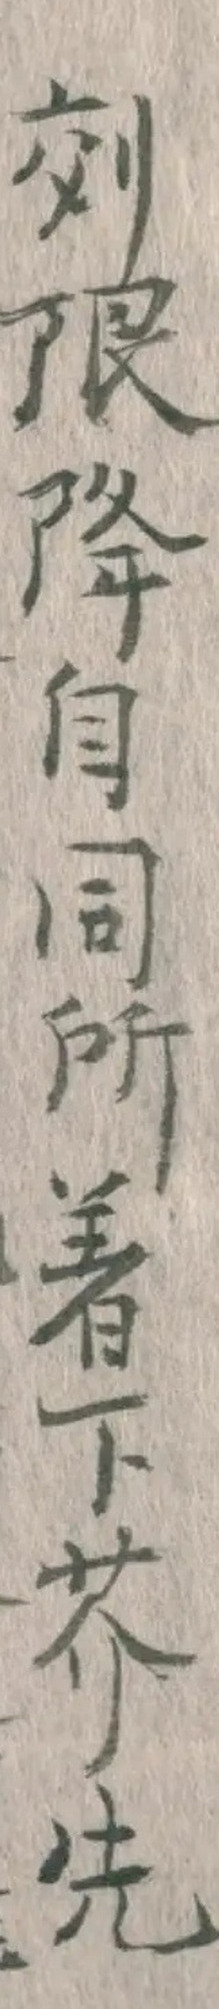刻限降自同所着下芥先
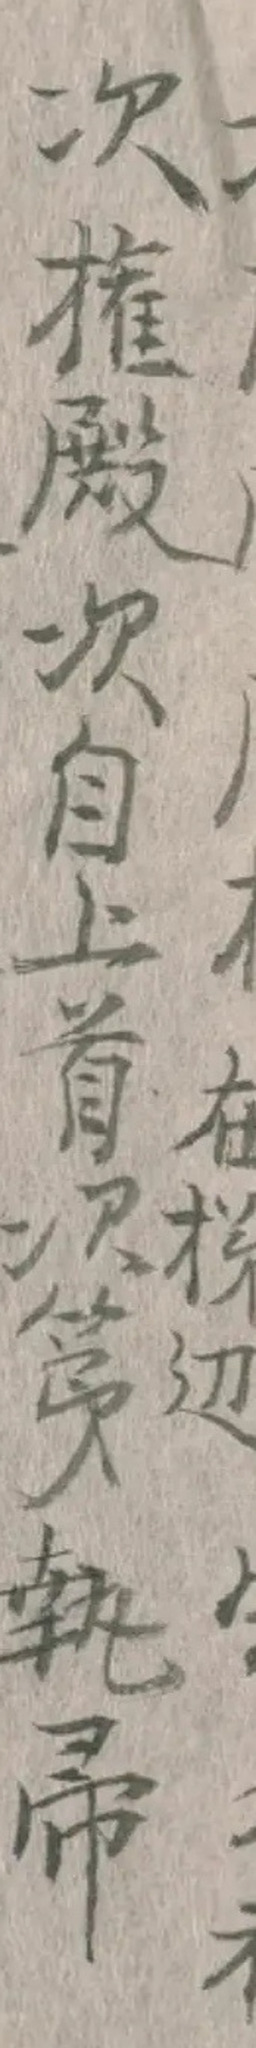次権殿次自上首次第執箒
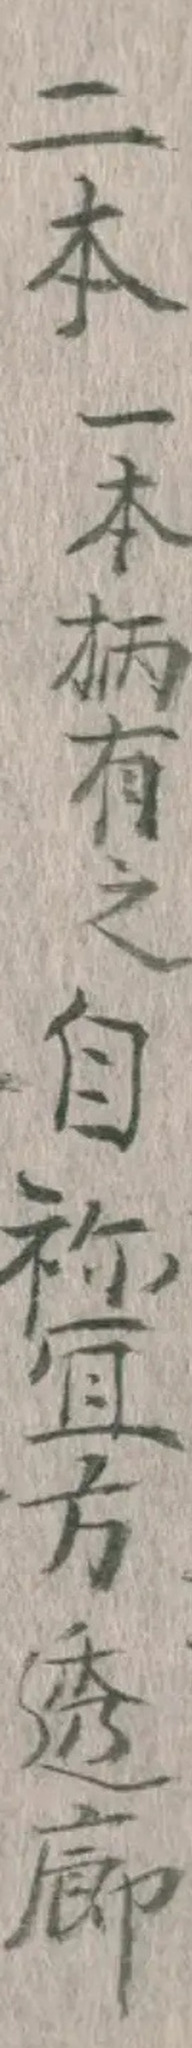二本一本柄有之自弥宜方透廊
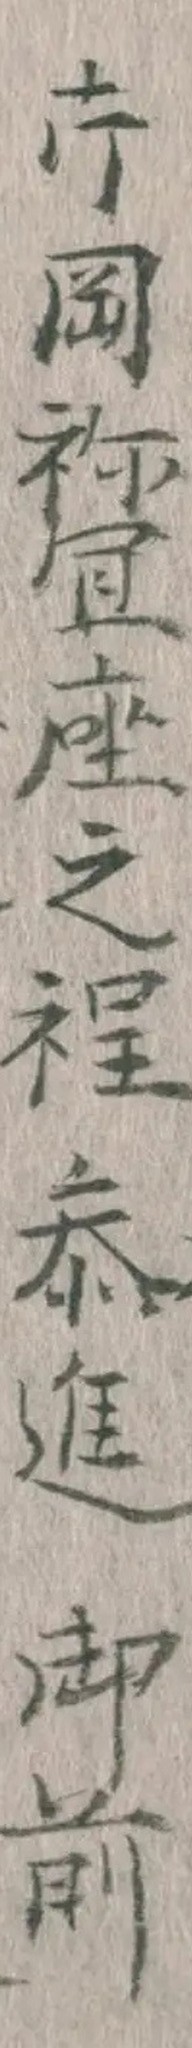片岡祢宜座之程参進御前
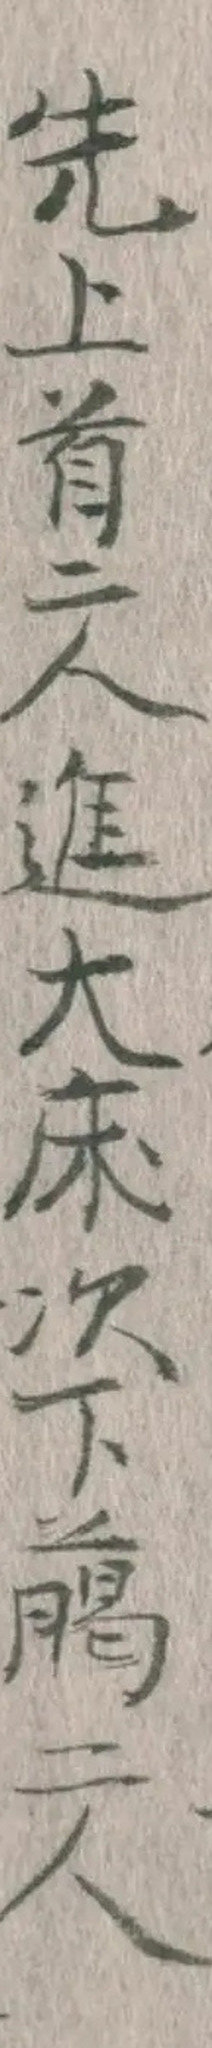先上首二人進大床次下臈二人
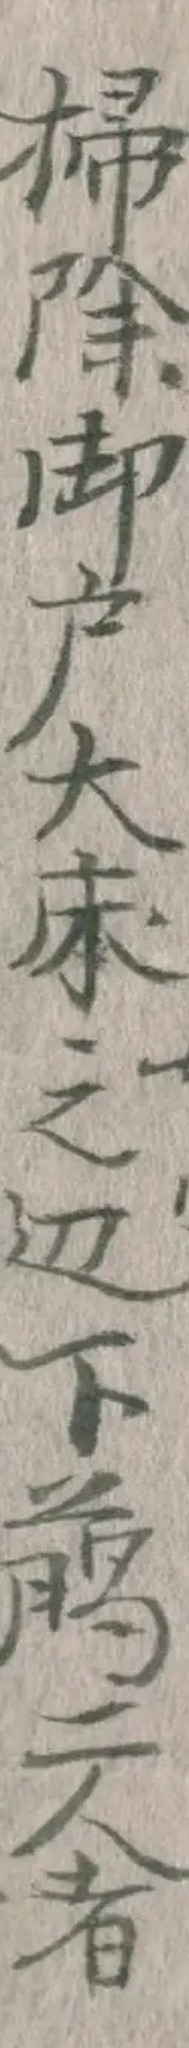掃除御戸大床之辺下臈二人者
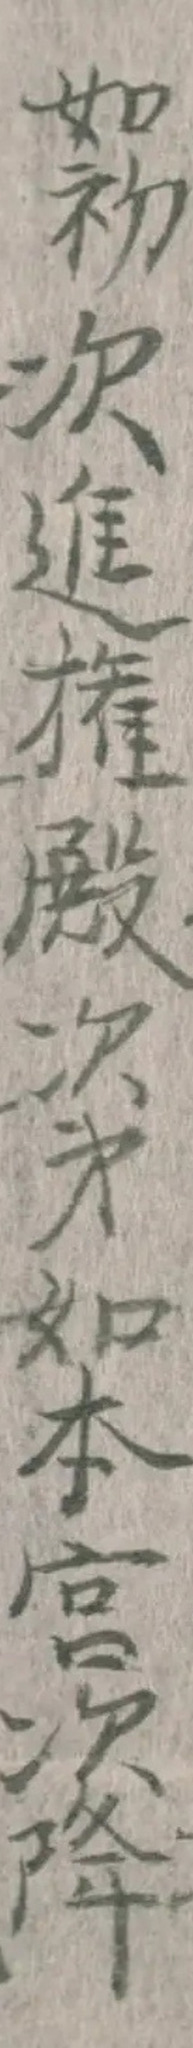如初次進権殿次第如本宮次降
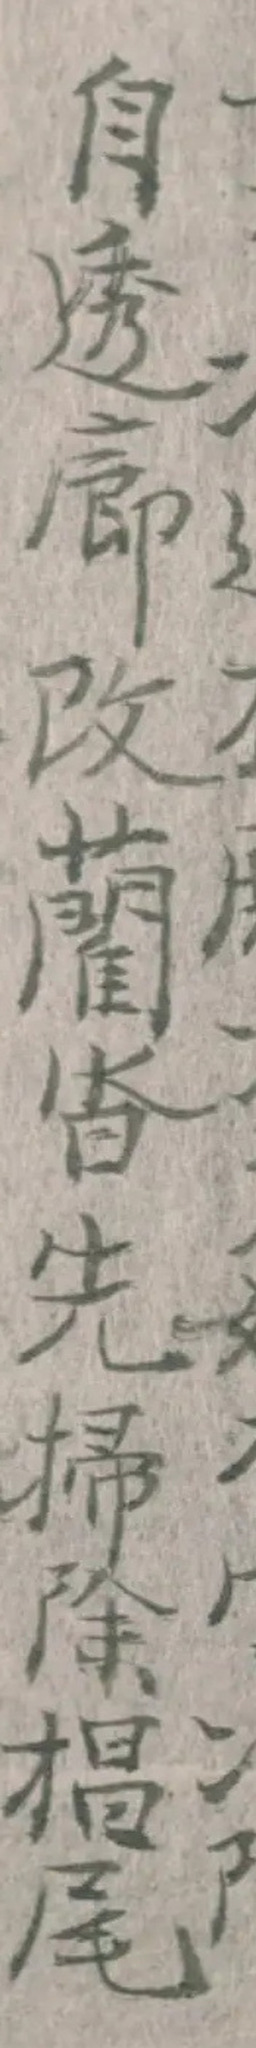自透廊改藺沓先掃除椙尾
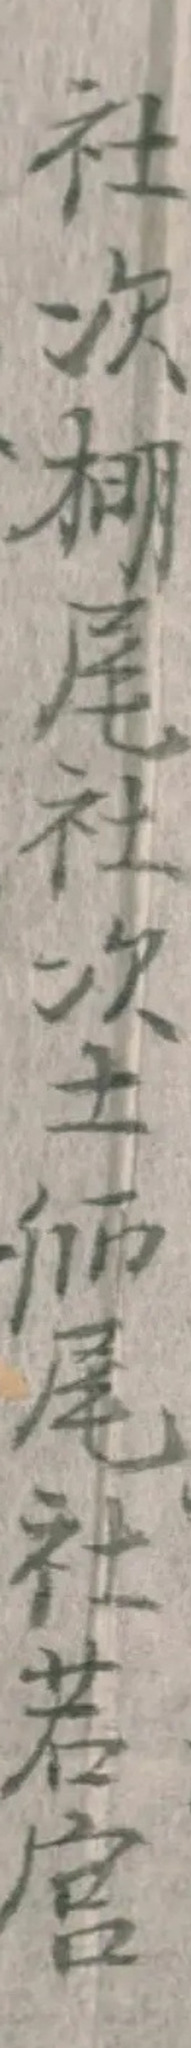社次棚尾社次土尾社若宮
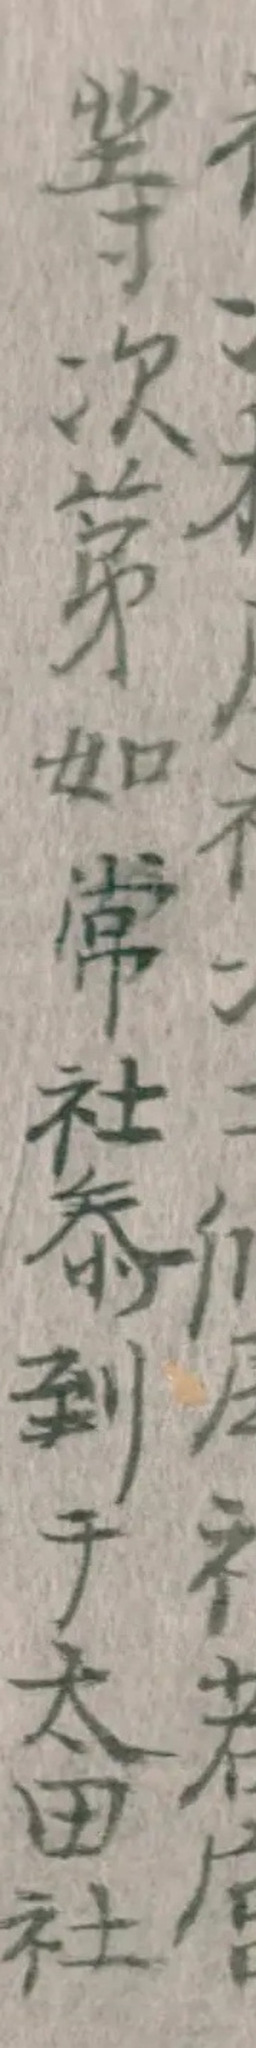等次第如常社参到于太田社
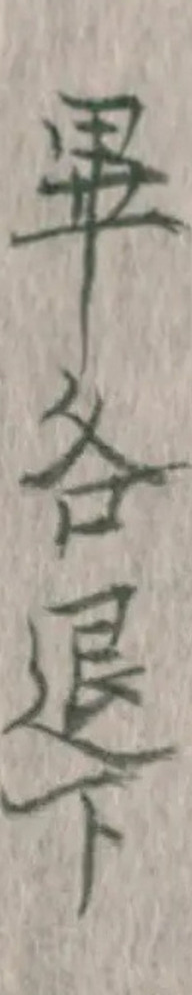畢各退下
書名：賀茂社記録. 第81冊
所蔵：国立国会図書館 National Diet Library, JAPAN
